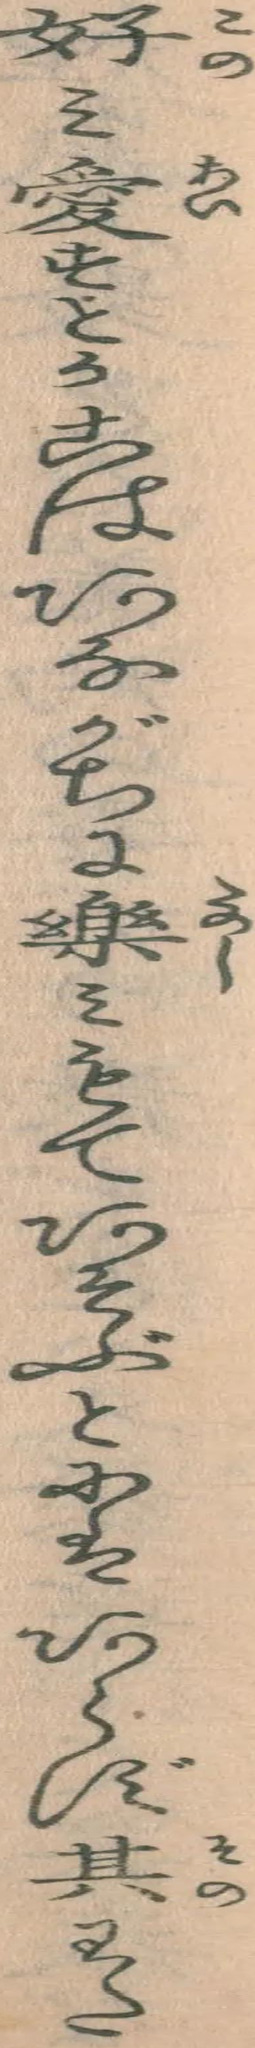好み愛すとかこはあながちに楽みもてあそぶとにはあらず其わた
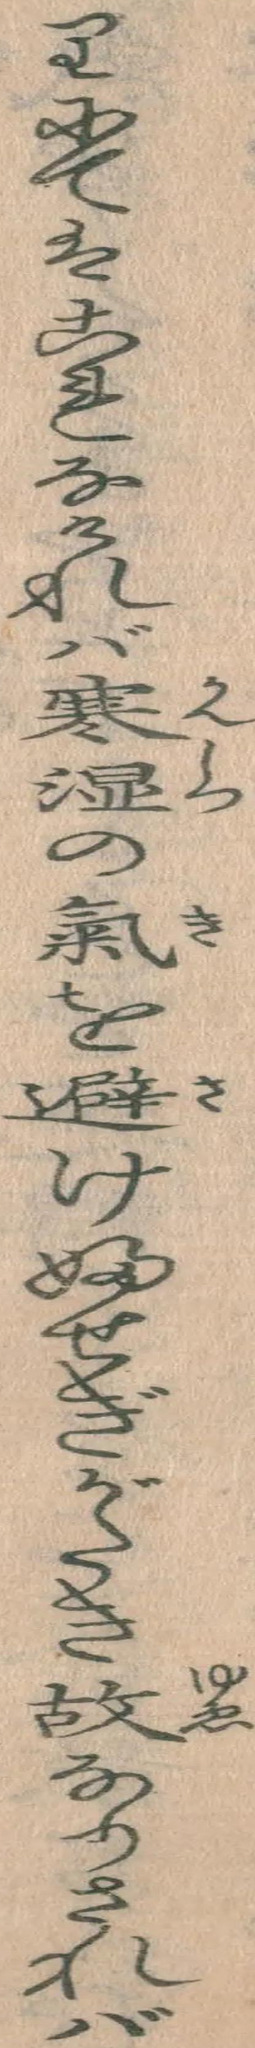りにてはこれなければ寒湿の気を避けふせぎがたき故なりされば
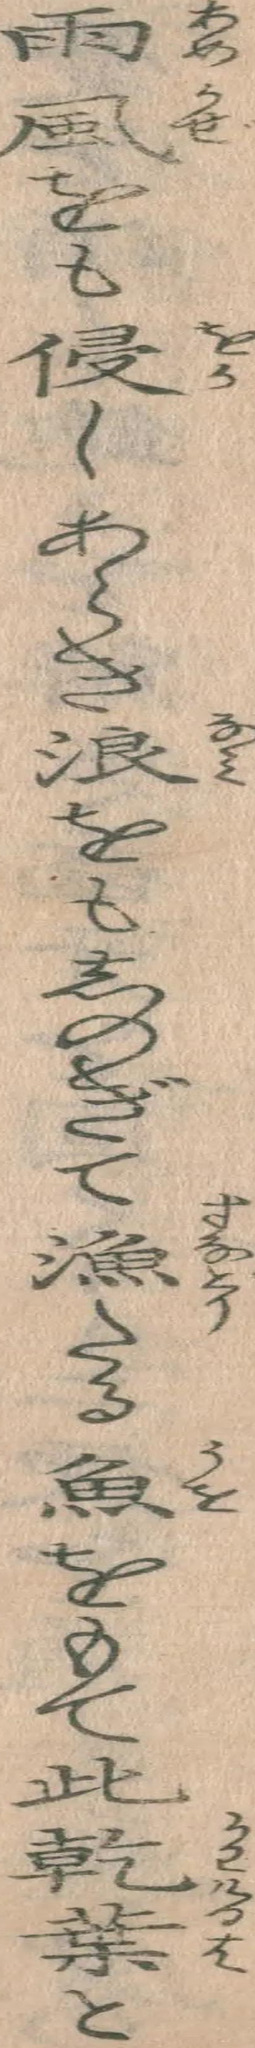雨風をも浸しあらき浪をもしのぎて漁たる魚をもて此乾葉と
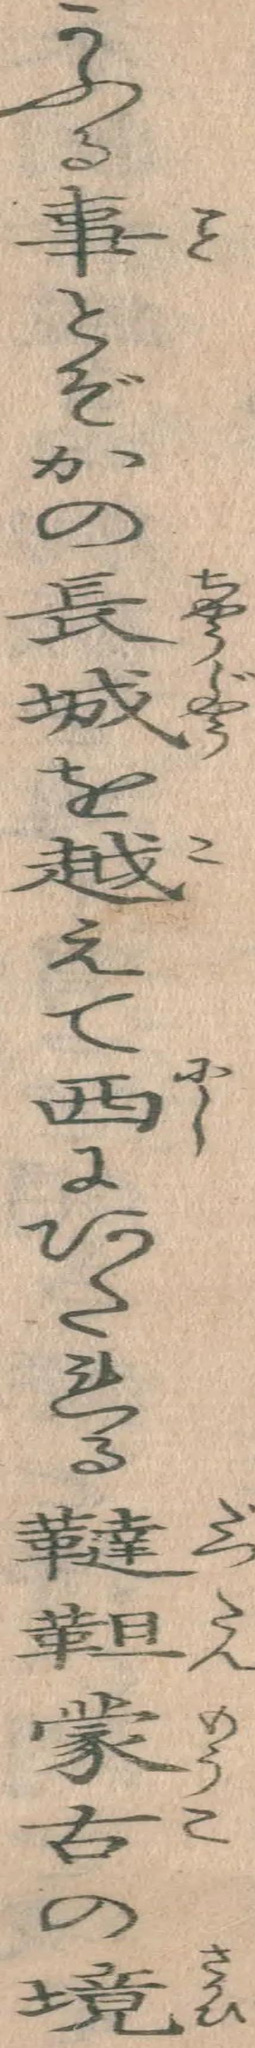かふる事とぞかの長城を越えて西にあたれる韃靼蒙古の境
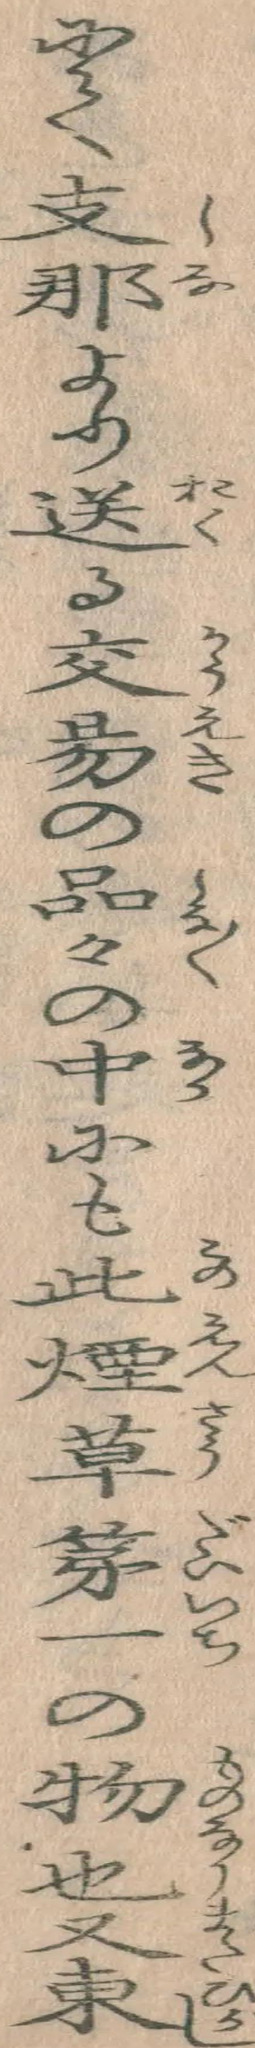にて志那より送る交易の品々の中にも此煙草第一の物也又東
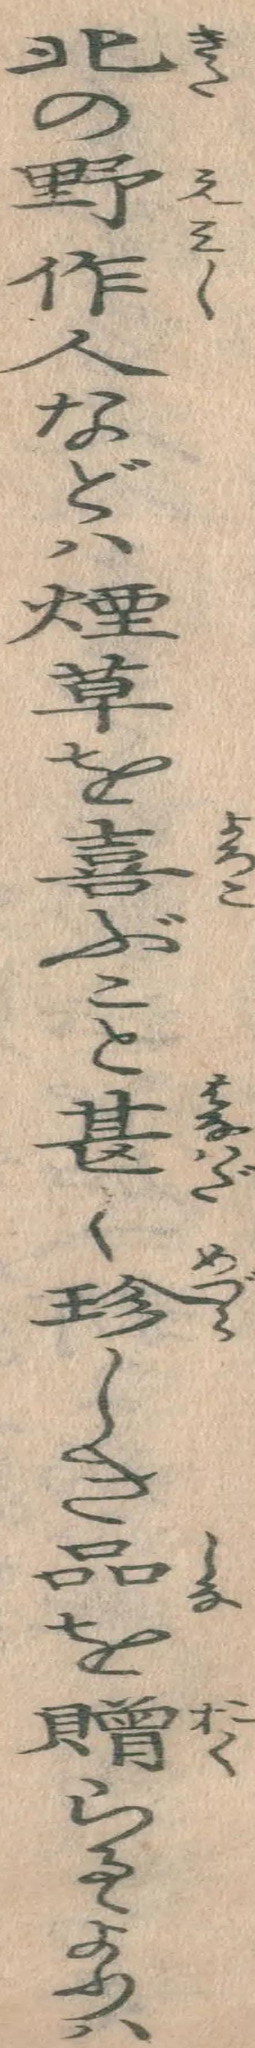北の野作人などは煙草を喜ぶこと甚し珍しき品を贈らるゝよりは
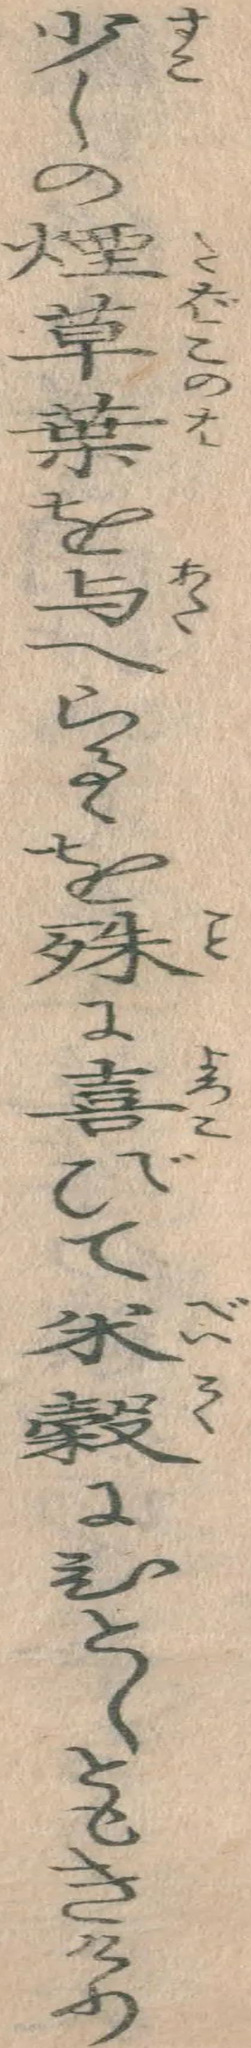少しの煙草葉を与へらるゝを殊に喜びて米穀にひとしともきけり
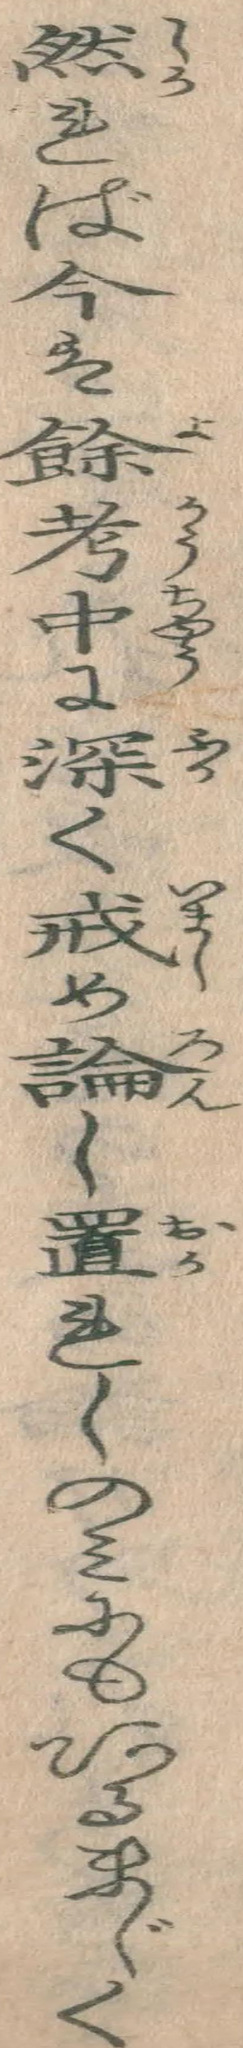然れば今は余考中に深く戒め論し置れしのみにもあるまじく
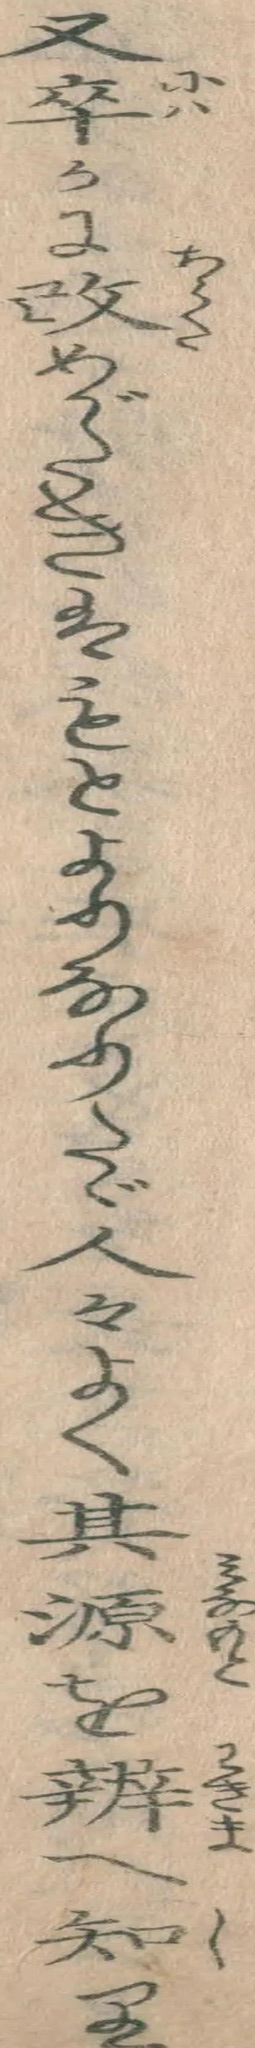又卒かに改めがたきはもとよりなりたゞ人々よく其源を弁へ知り
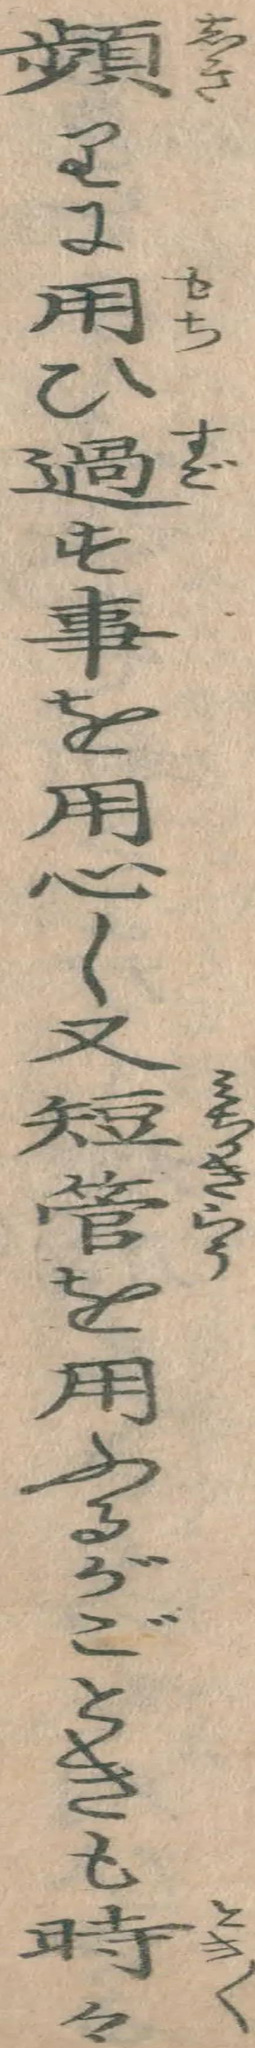頻りに用ひ過す事を用心し又短管を用ふるがごときも時々

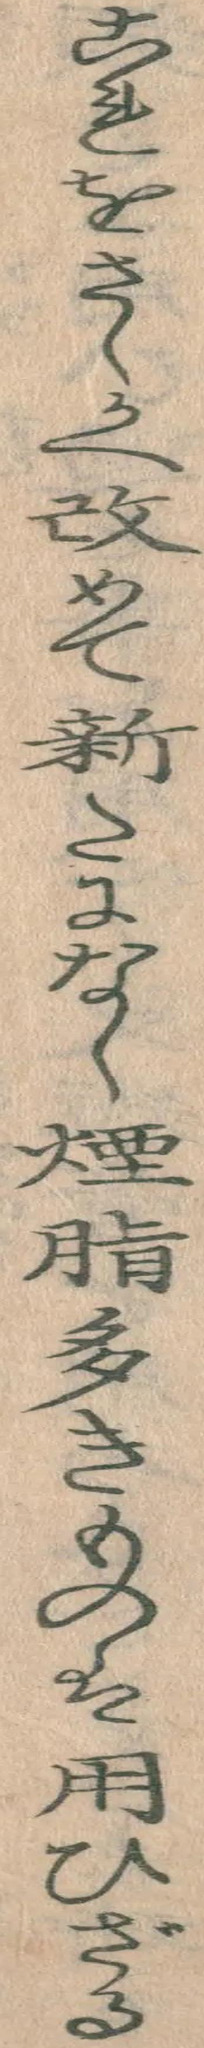これをさしかへ改めて新たになし煙脂多きものは用ひざる
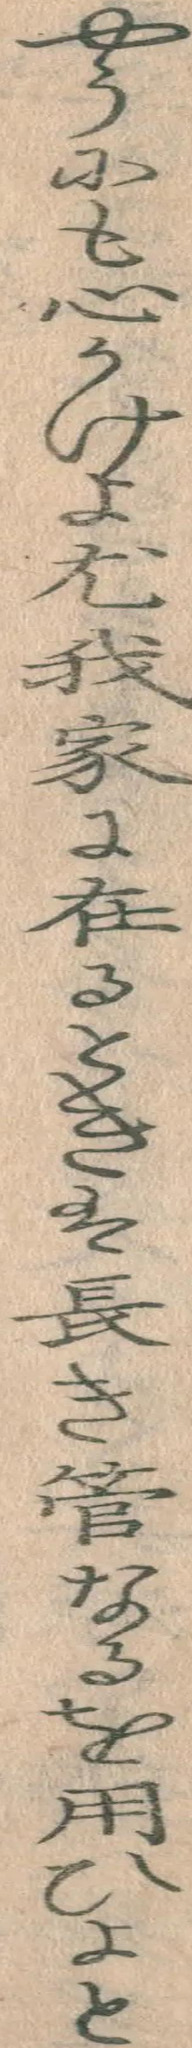やうにも心かけよ尤我家に在るときは長き管なるを用ひよと
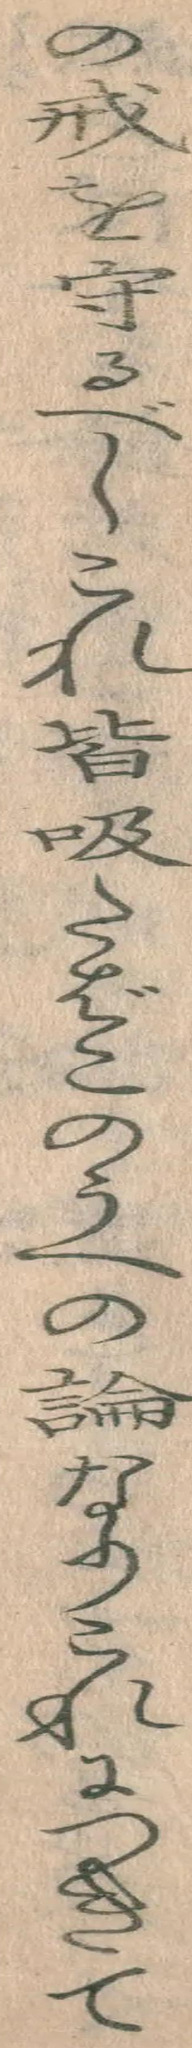の戒を守るべしこれ皆吸たばこのうへの論なりこれにつきて
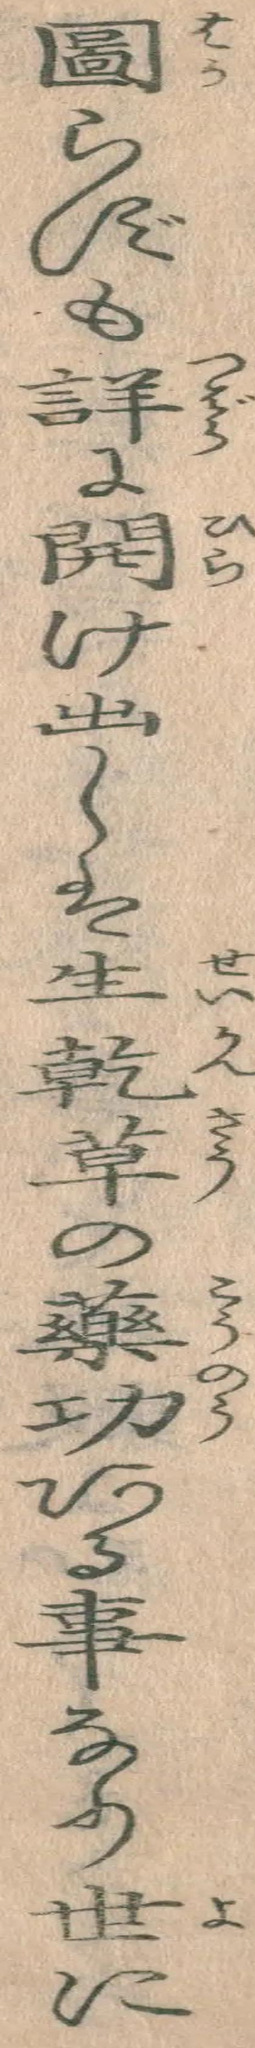図らずも詳に開け出しは生乾草の薬功ある事なり世に
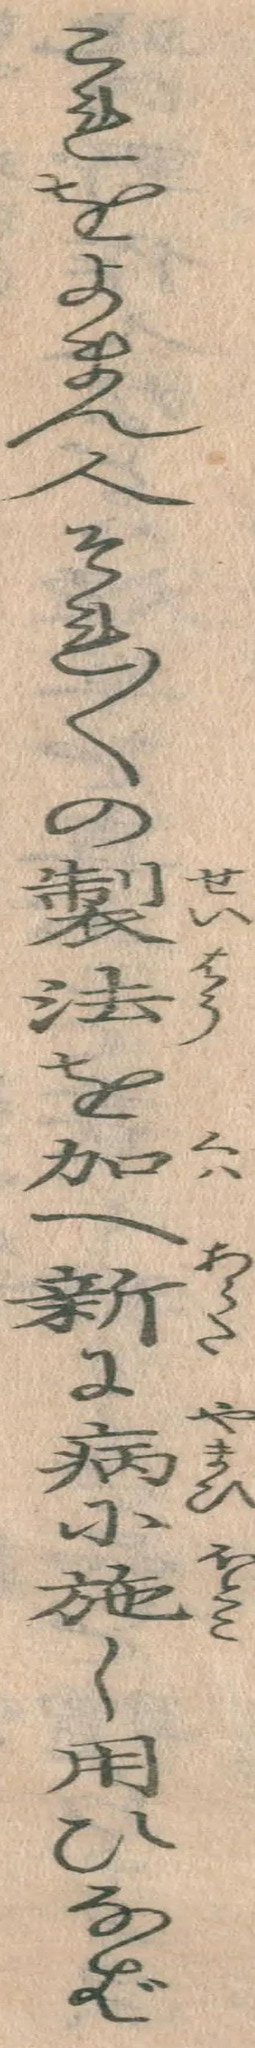これをよまん人それ〳〵の製法を加へ新に病に施し用ひなば
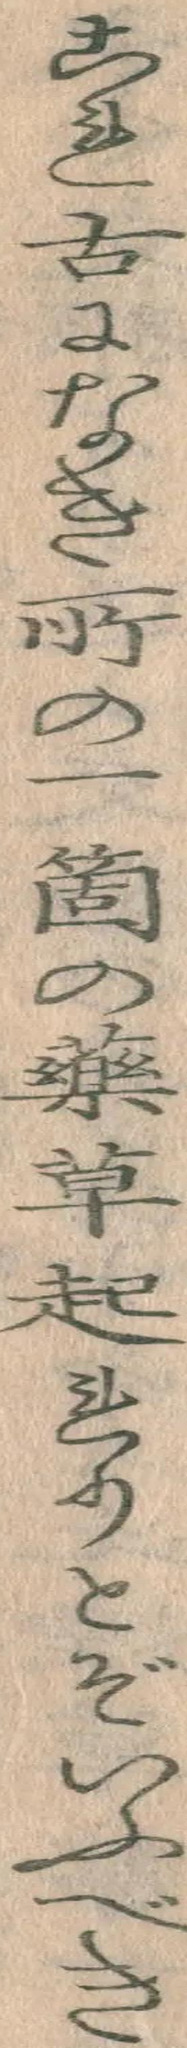これ古になき所の一箇の薬草起れりとぞいふべき
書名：目さまし草
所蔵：国立国会図書館 National Diet Library, JAPAN
